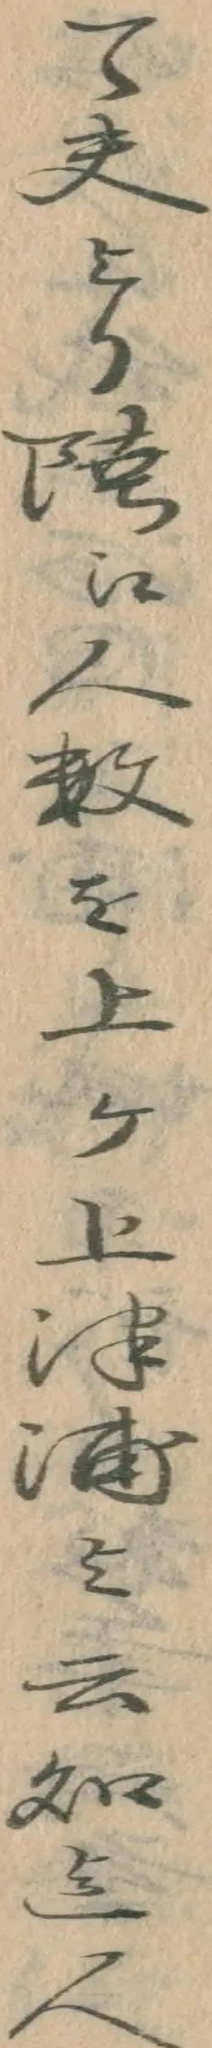て夫与り陸江人数を上け上津浦与云処迄人
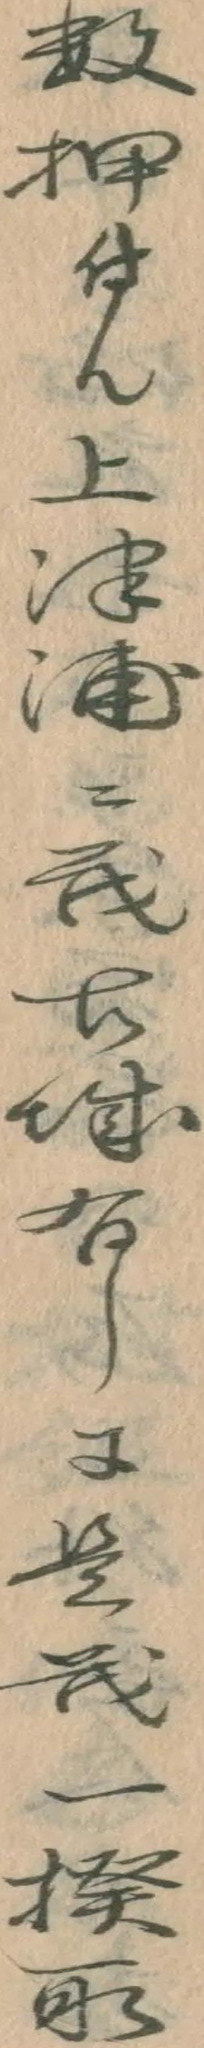数押付ん上津浦に茂古城有し尓是茂一揆取
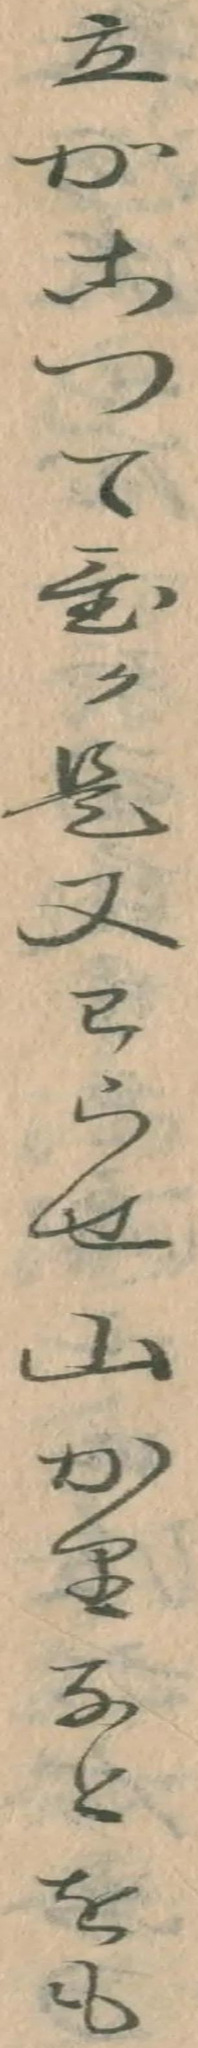立加古つて置く是又已らせ山加里なとをも

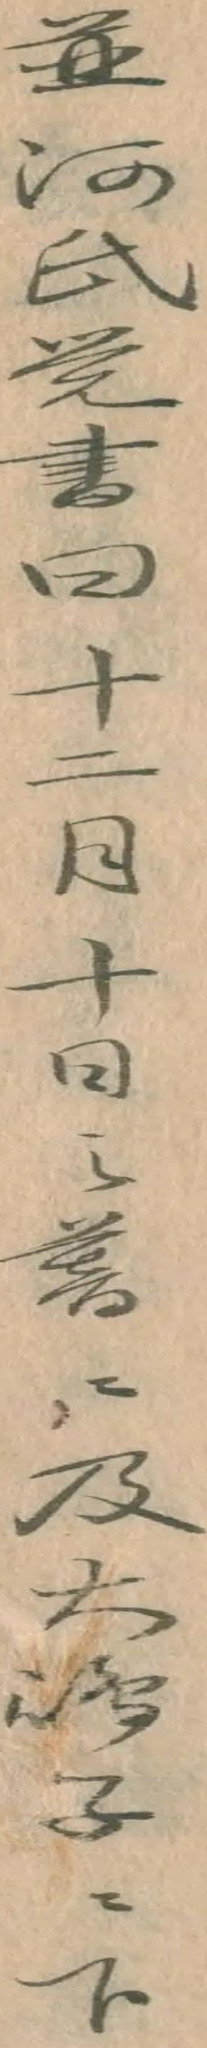並河氏覚書曰十二月十日之暮に及大島子に下
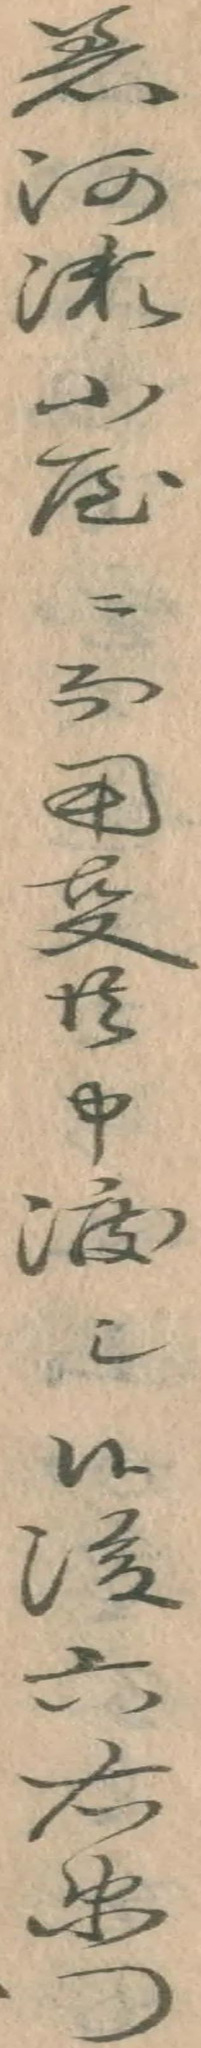着河瀬小屋に而用事共申渡し候後六右衛門
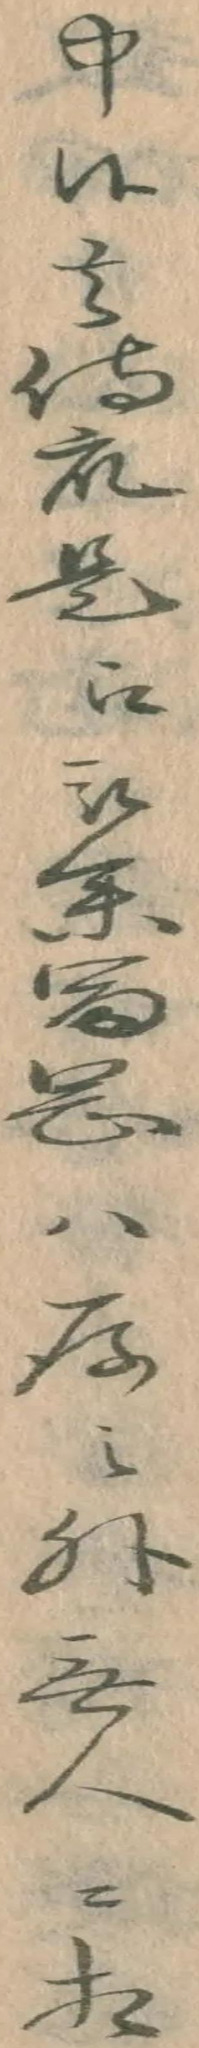申候者侍衆是江被参冨岡は存之外無人に相
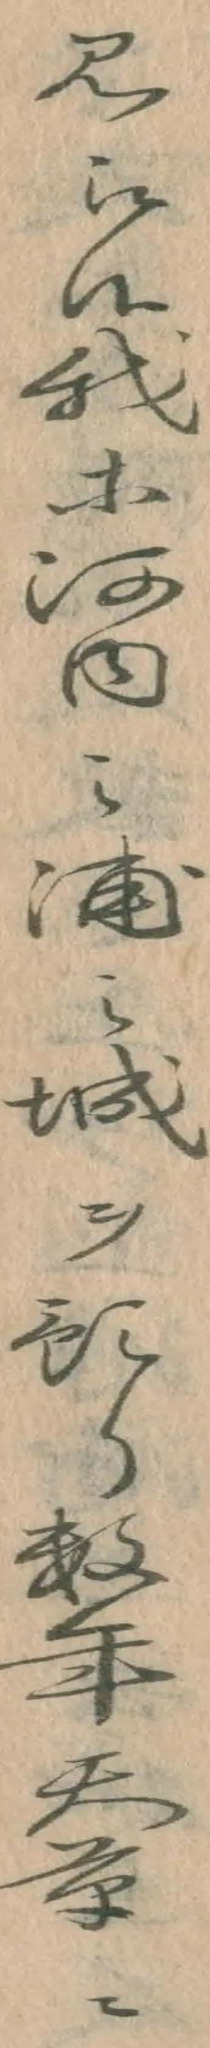見江候我等河内之浦之城を預り数年天草に
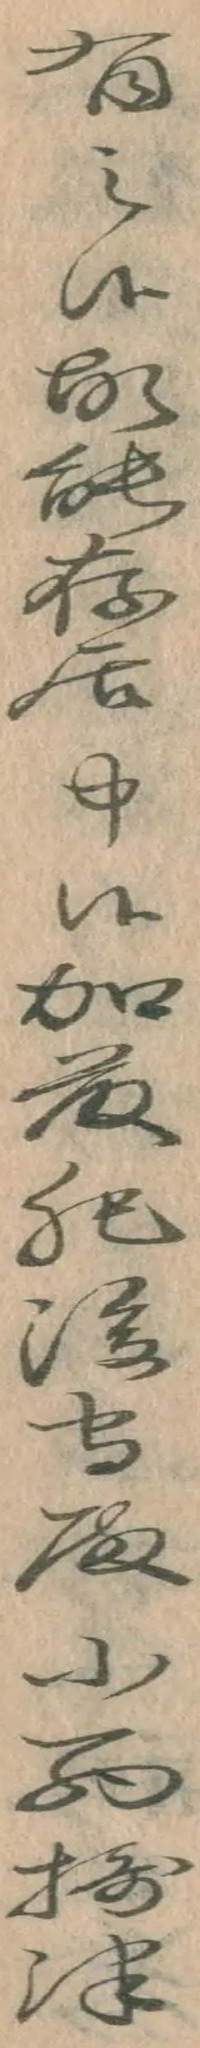有之候故能存居申候加藤肥後守殿小西摂津
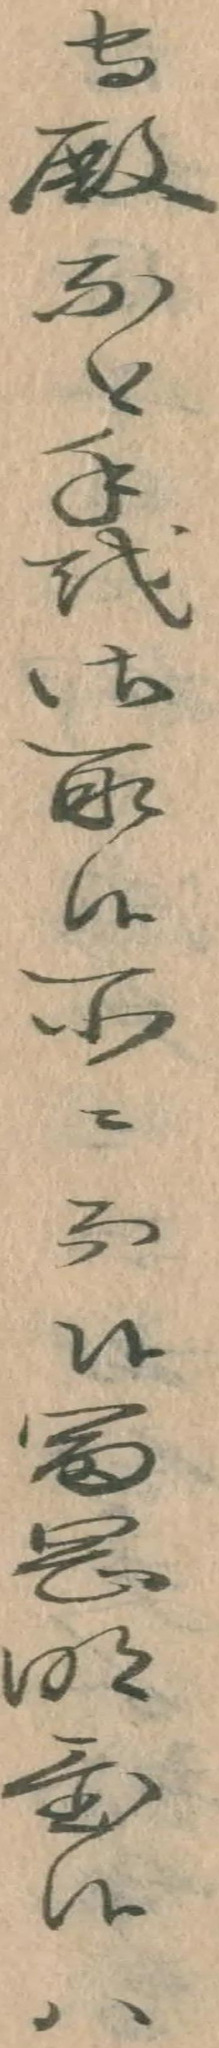守殿なと手越御取候所に而候冨岡明置候は
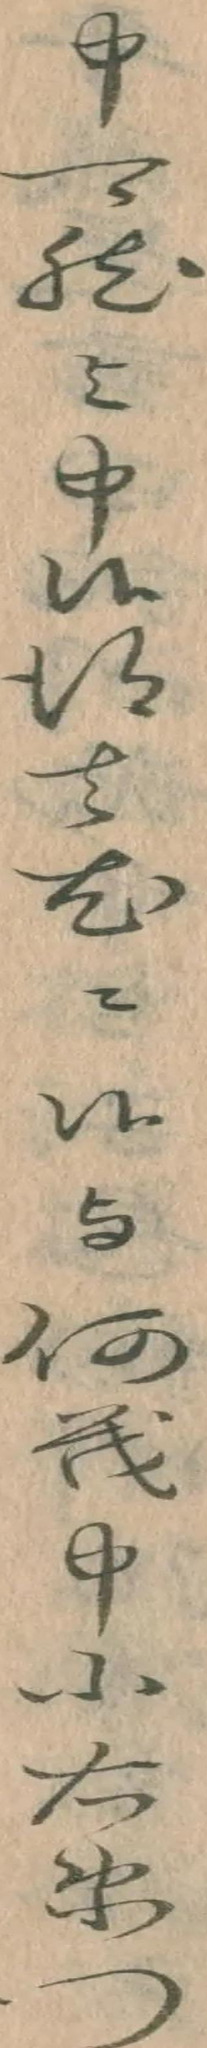申可然与申候得者尤に候与何茂申小右衛門
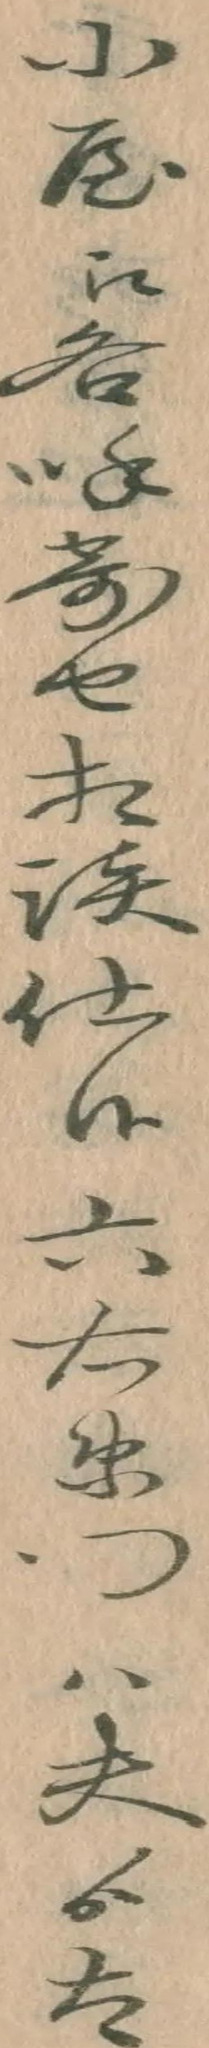小屋江各呼寄せ相談仕候六右衛門は夫ゟ太
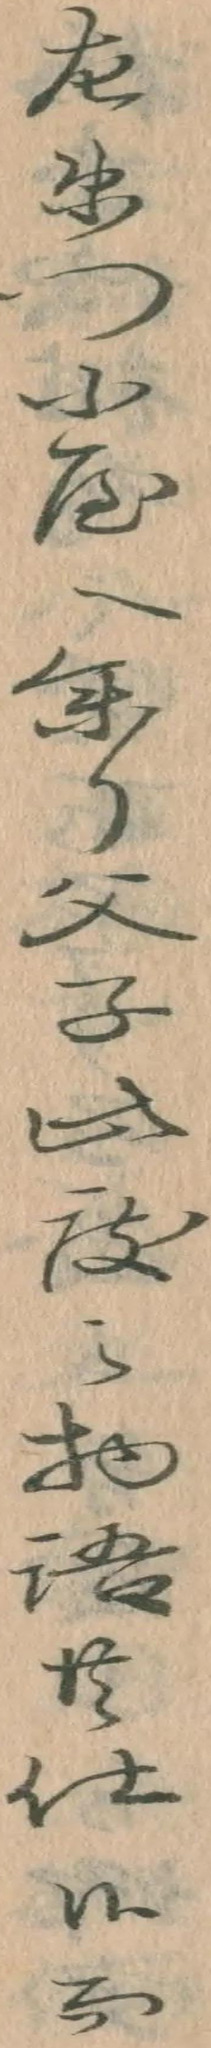左衛門小屋へ参り父子此度之物語共仕候而
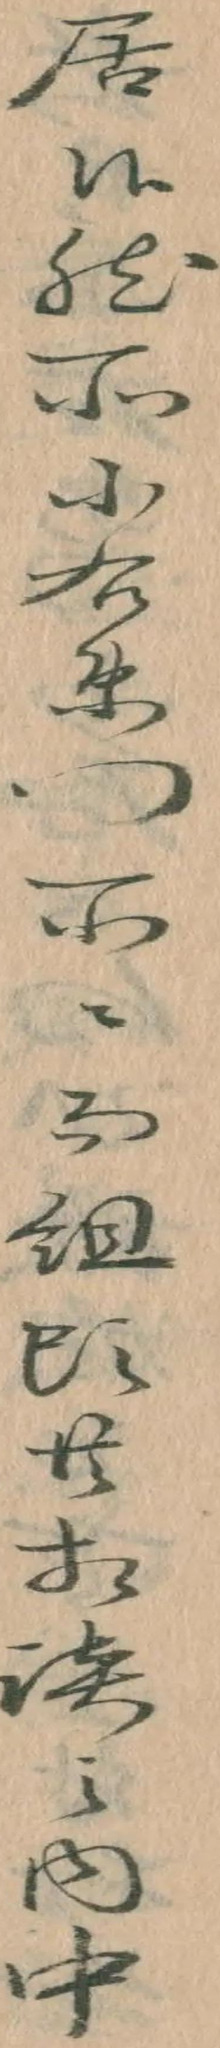居候然所小右衛門所に而組頭共相談之内中
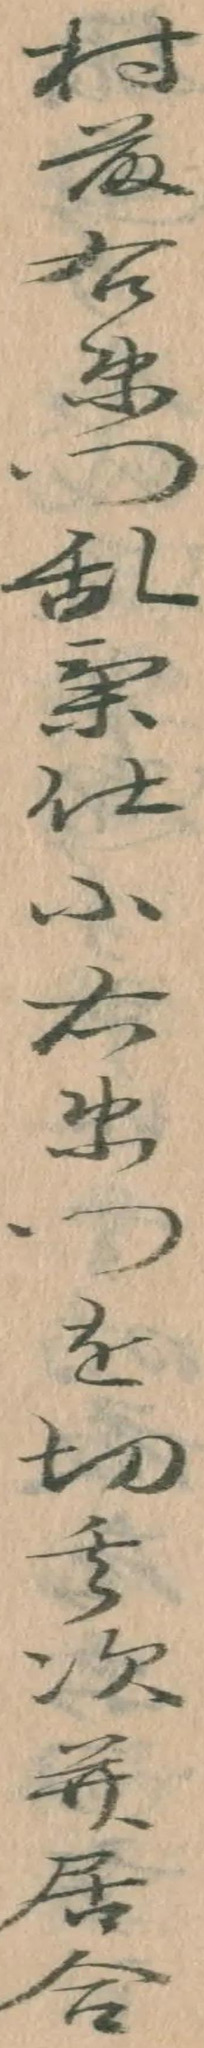村藤右衛門乱気仕小右衛門を切其次幷居合
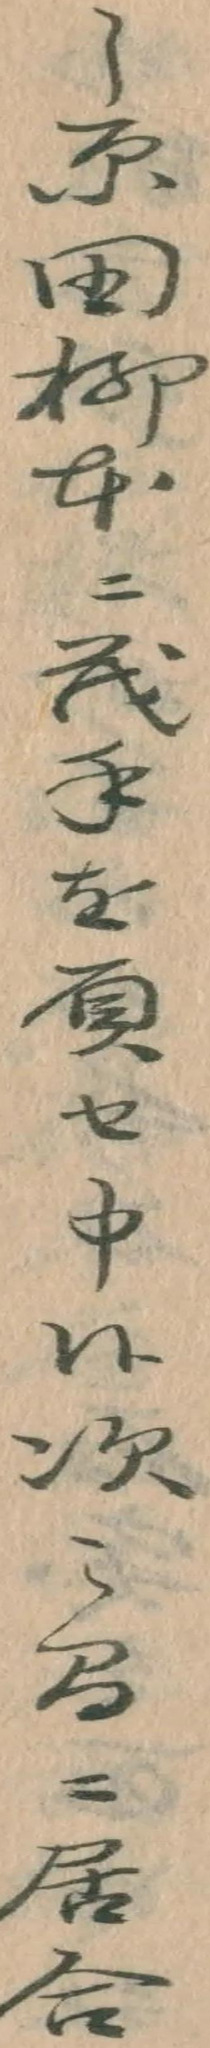し原田柳本に茂手を負せ申候次之間に居合
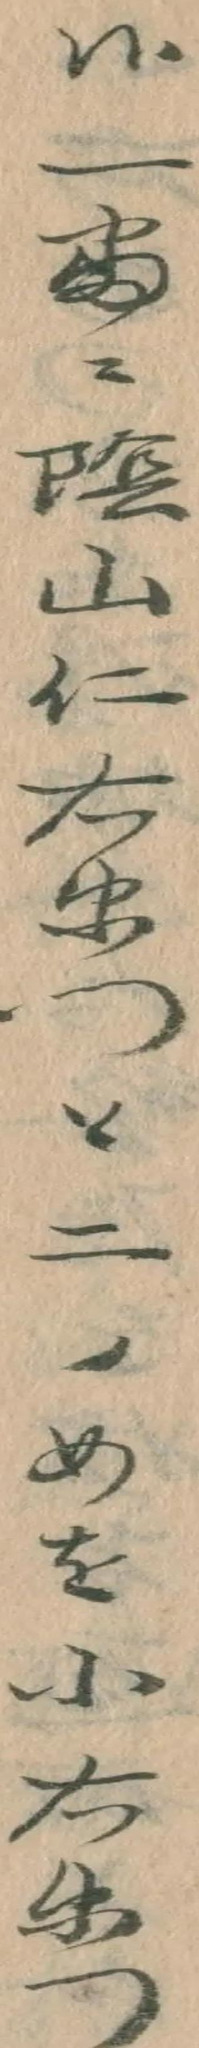候一番に陰山仁右衛門と二之めを小右衛門
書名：切支丹御退治記 49巻. [4]
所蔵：国立国会図書館 National Diet Library, JAPAN
